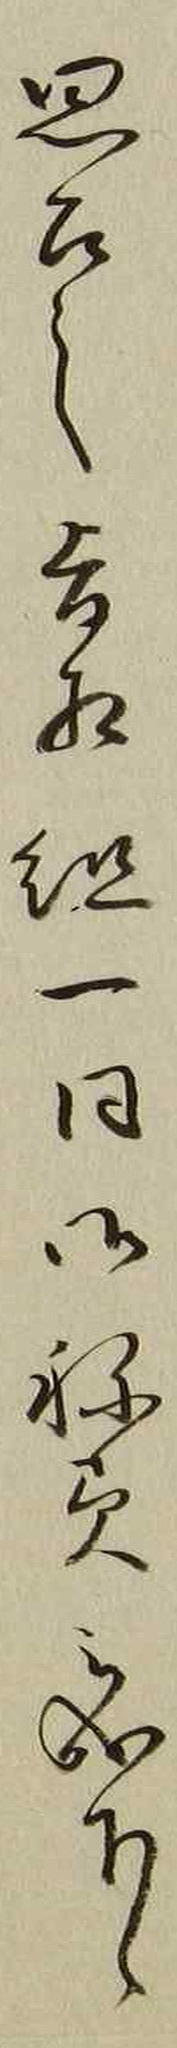思召之旨相組一同御称美被成下候
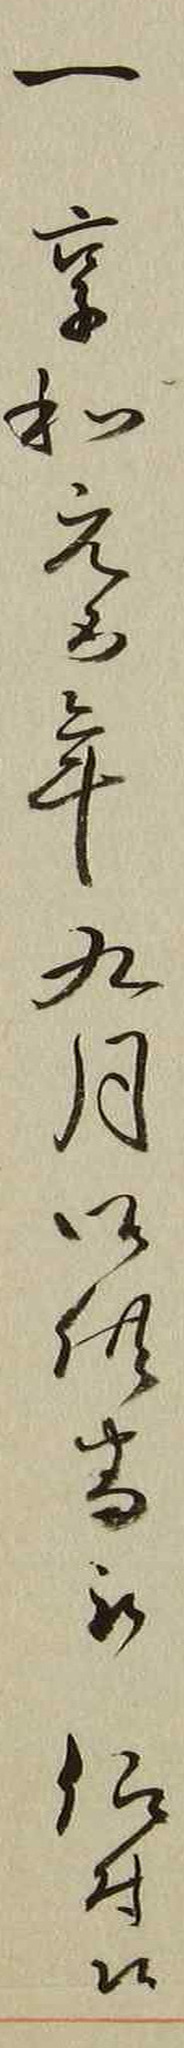一享和元酉年九月御供番被仰付候
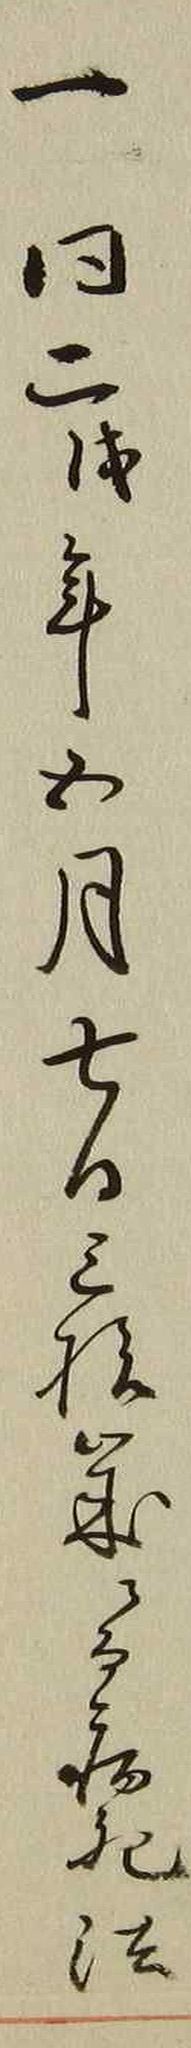一同二戌年五月七日三拾歳に而病死法
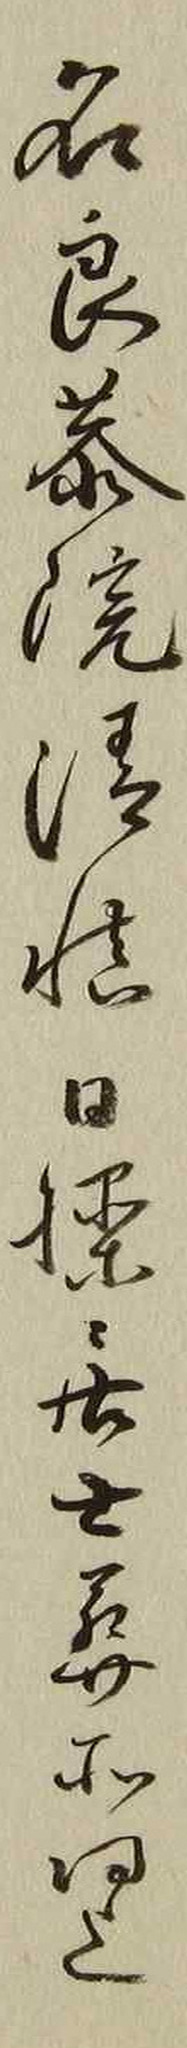名良恭院清慎日操居士葬所同上
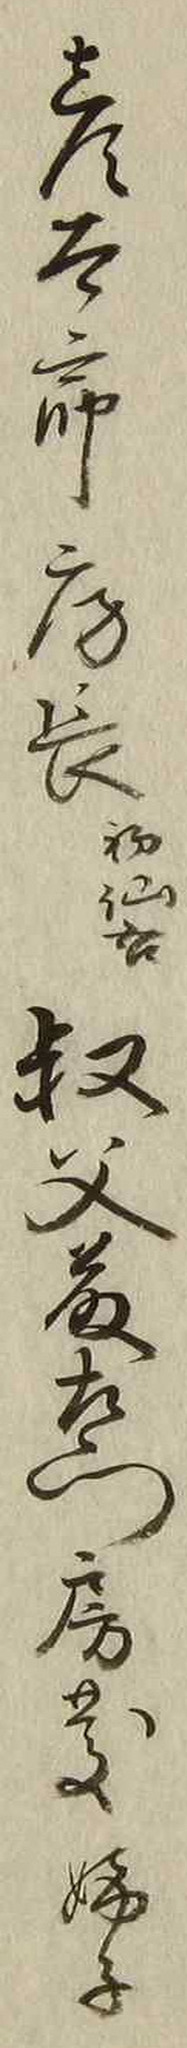彦太郎房長初仙吾叔父藤左衛門房慶嫡子
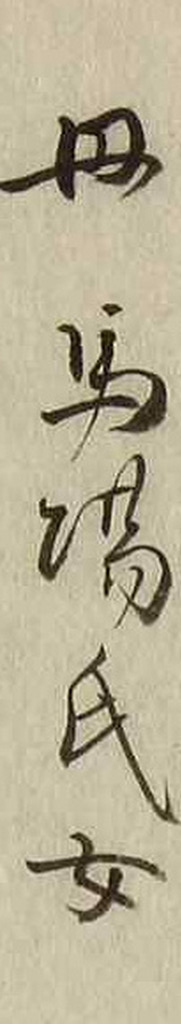母馬場氏女
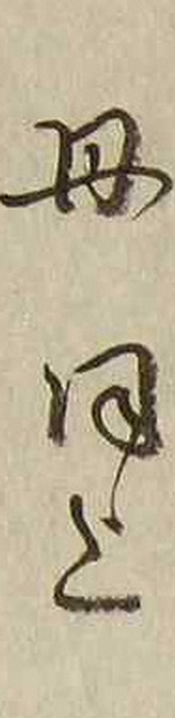母同上

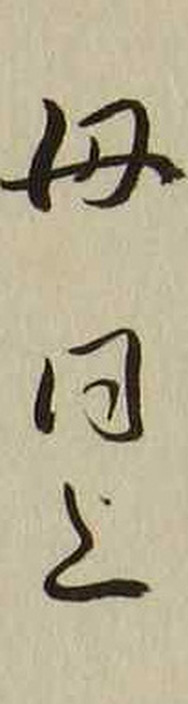母同上
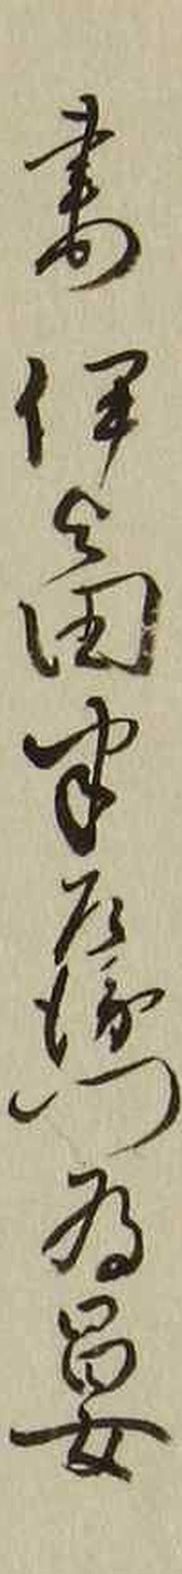妻伊与田半左衛門為昌女
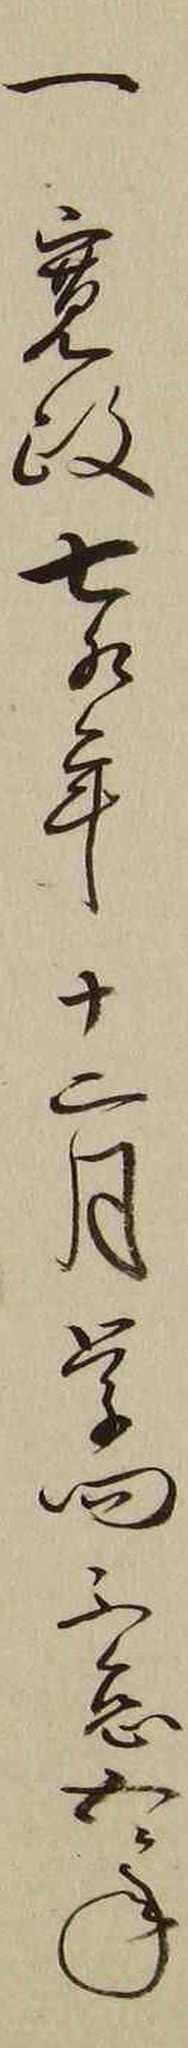一寛政七卯年十二月学問不怠五ケ年
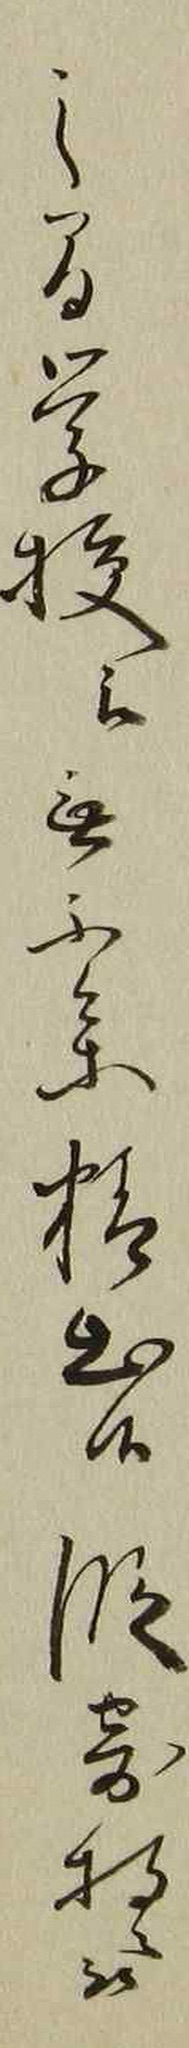之間学校江無不参精出候段奇特に被
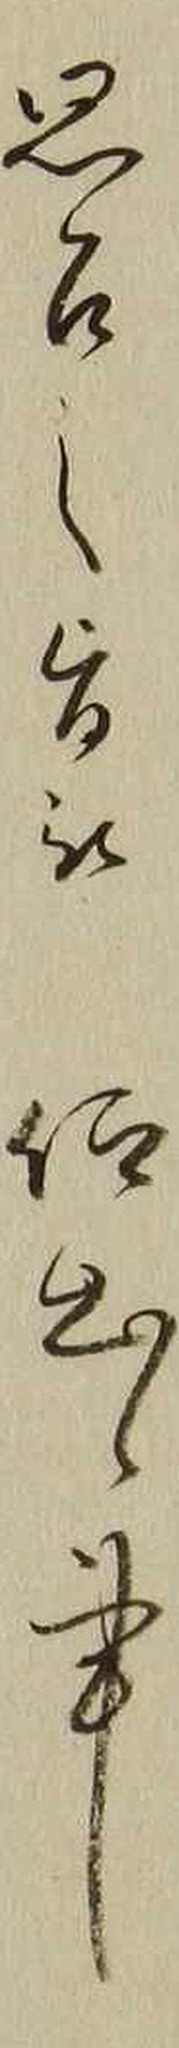思召之旨被仰出候事
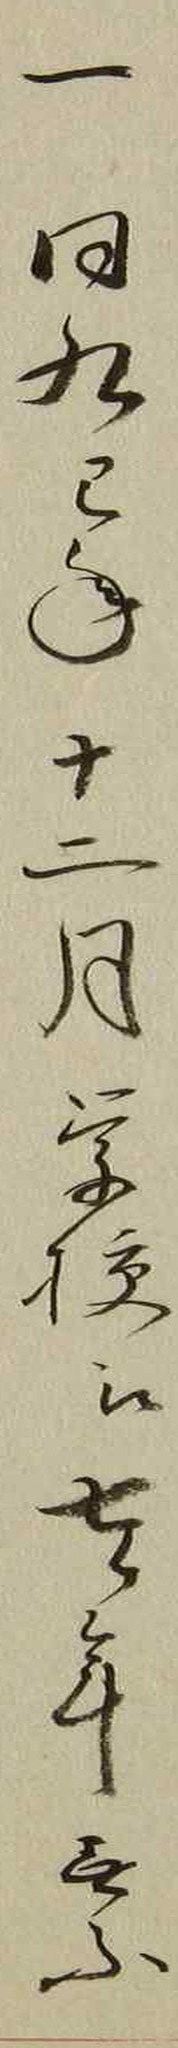一同九巳年十二月学校江七ケ年無不
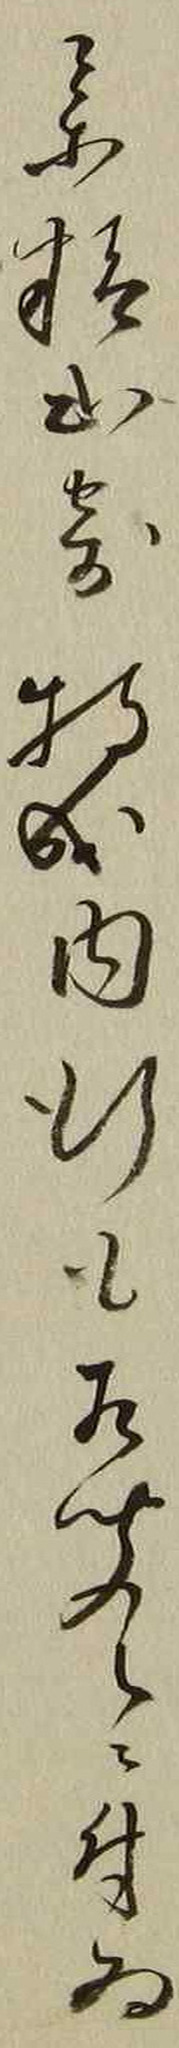参精出奇特成内行も相聞候に付為
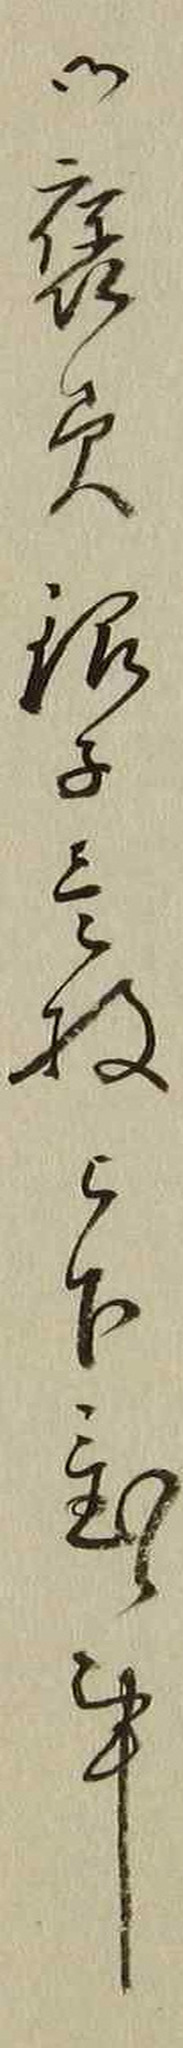御褒美銀子壱枚被下置候事
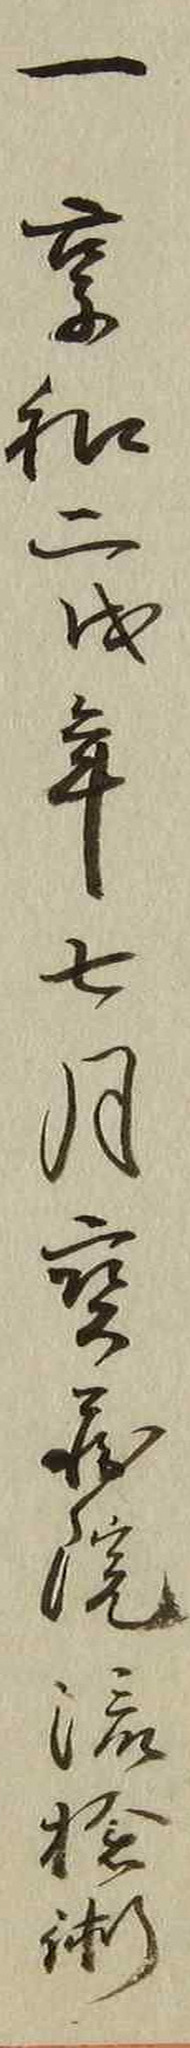一享和二戌年七月宝蔵院流槍術
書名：諸士系譜　巻之3　い之部3
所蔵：会津若松市立会津図書館
